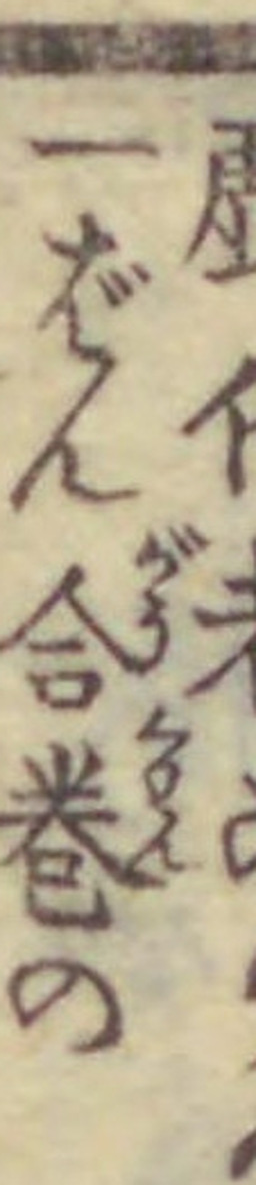一ばん合巻の
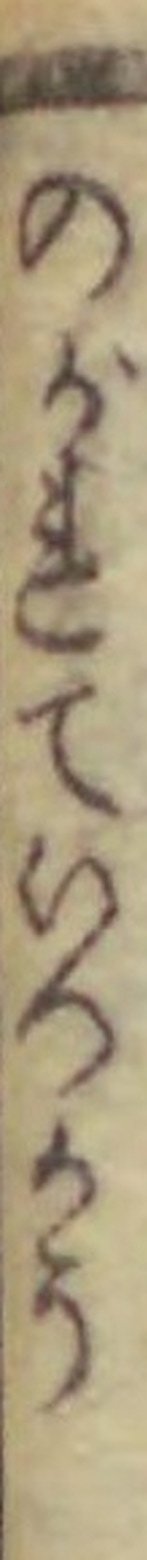のがれていつかう
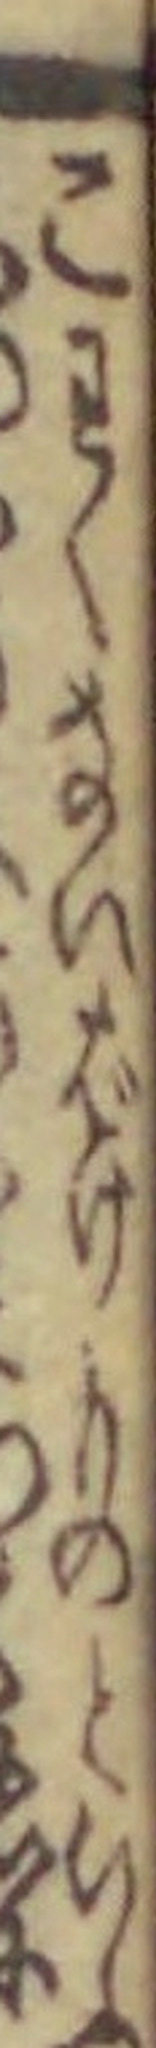こわくないばけものといふが
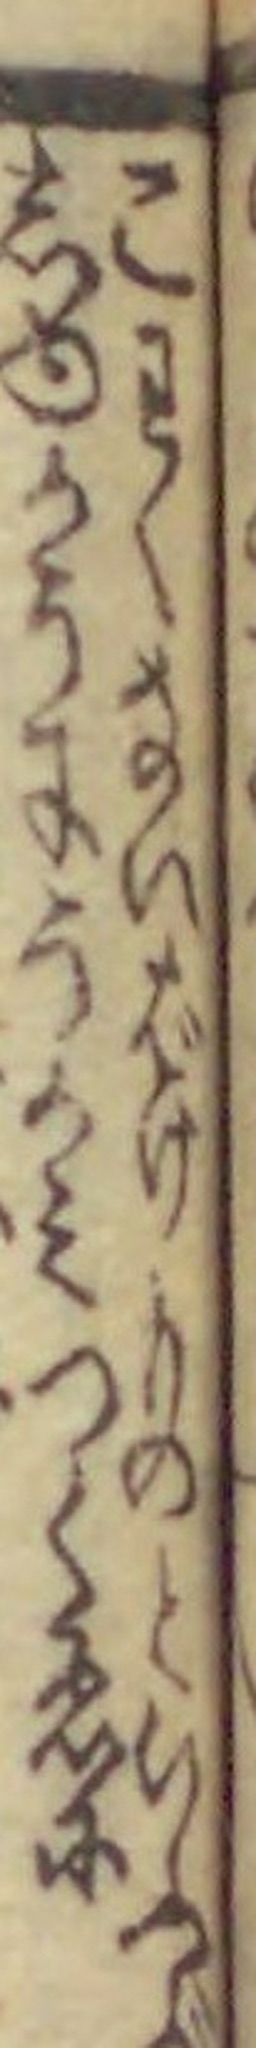しゆかうにうかみつくゑに
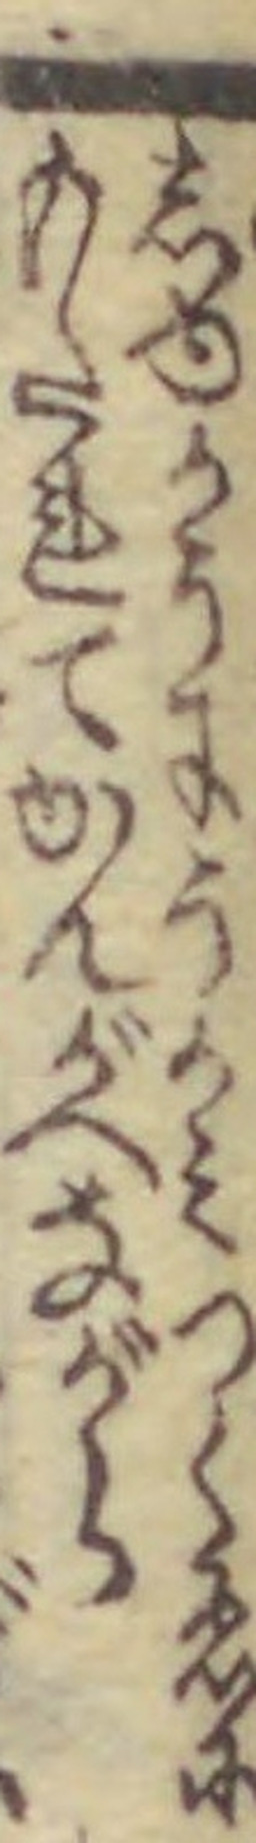もたれてかんがへながら
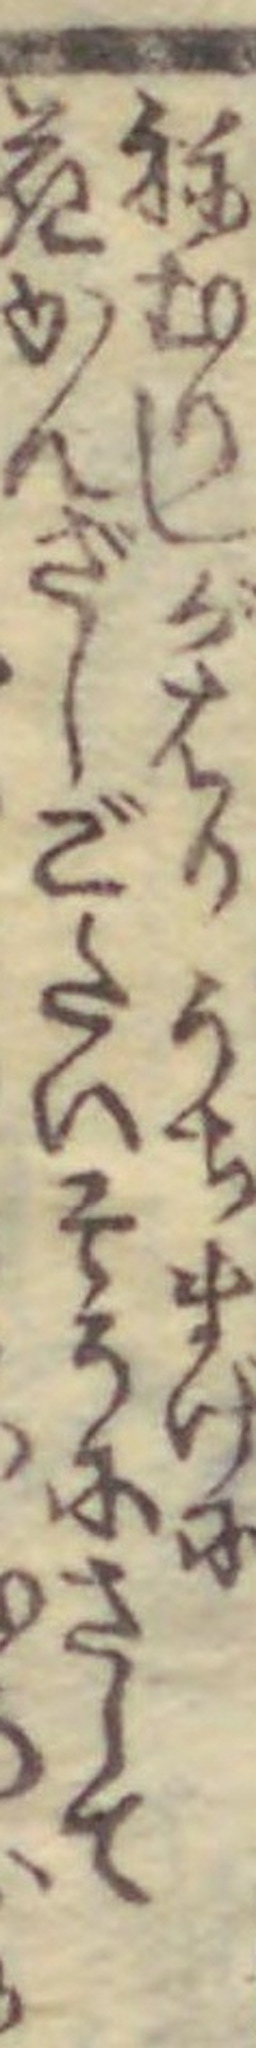花かんざしごたいそうにさして
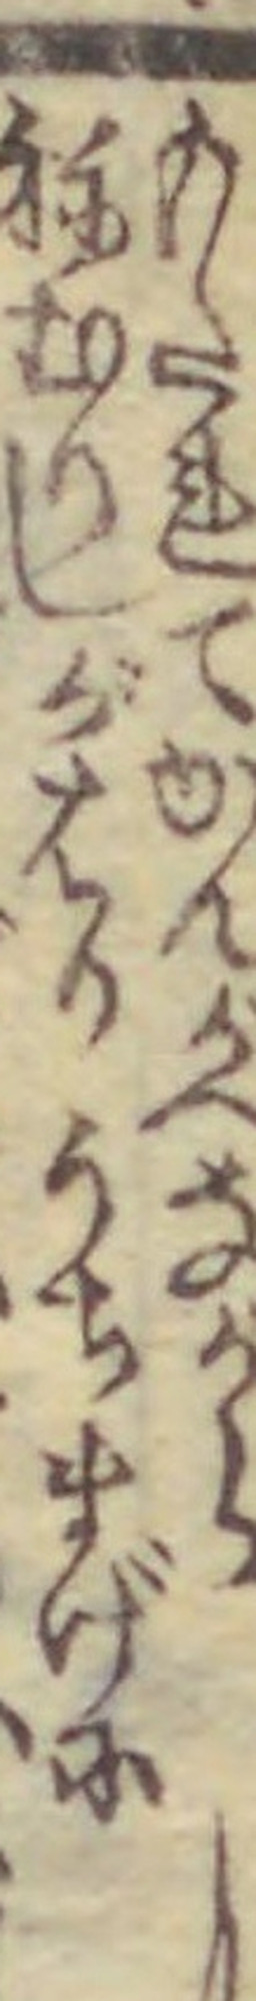ねむりしがはりうちまげに
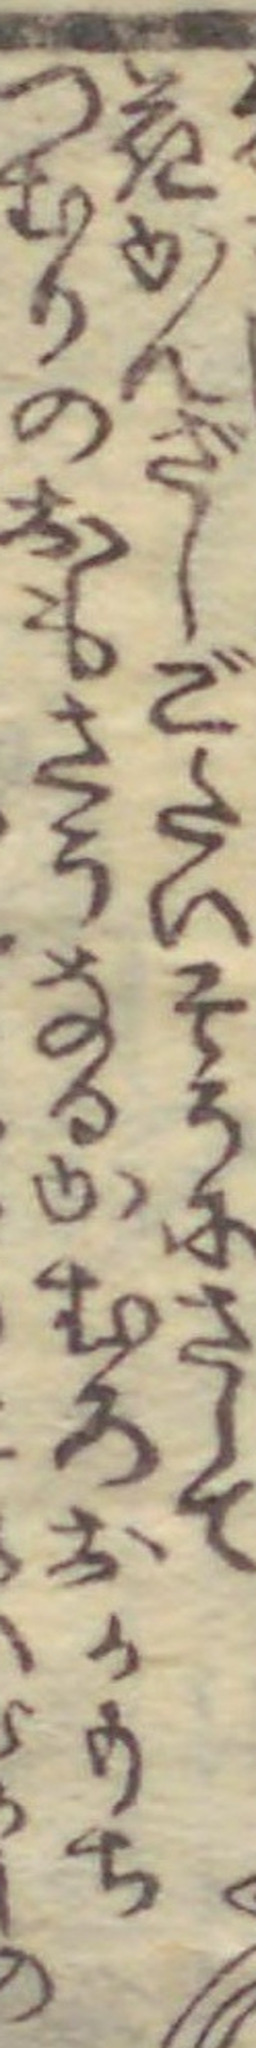つむりのおもさうなるかむろおかもち
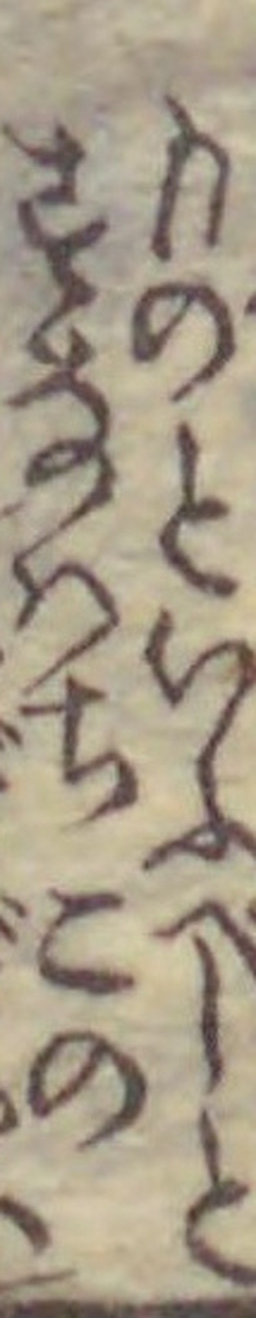すなはちこの
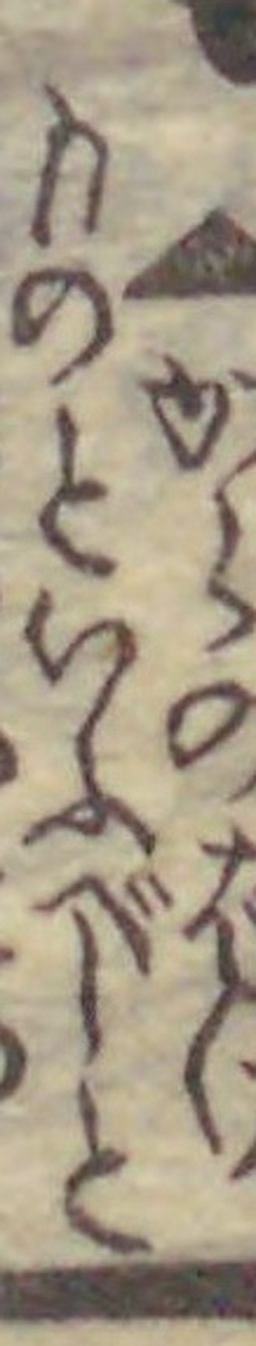ものといふべしと
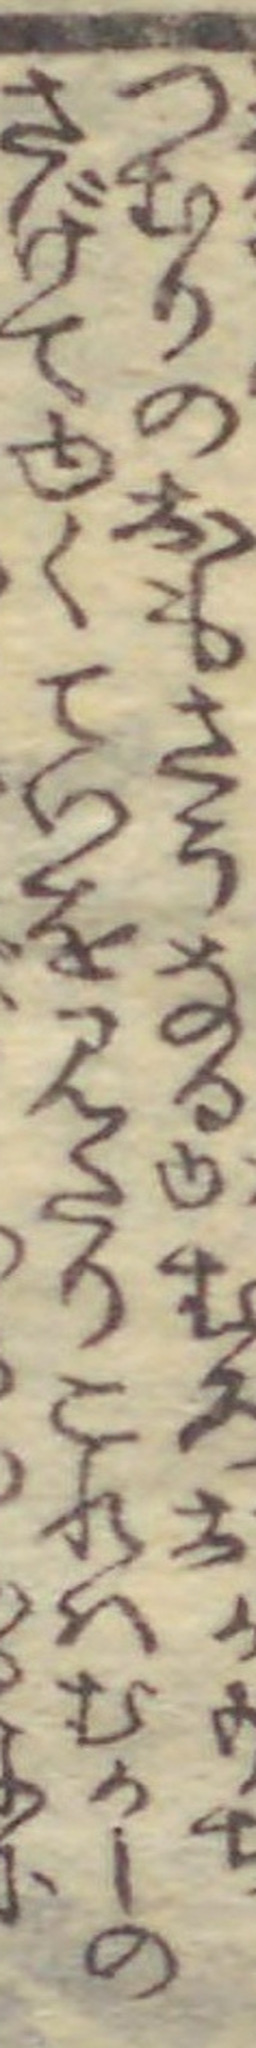さげてゆくていをみたりこれはむかしの
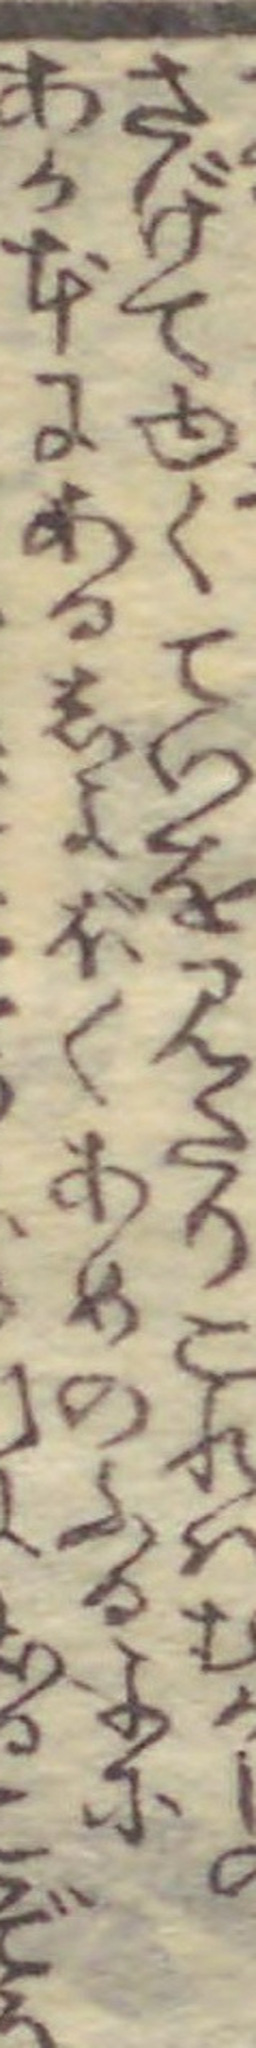あか本にあるしよぼ〳〵あめのふるよに
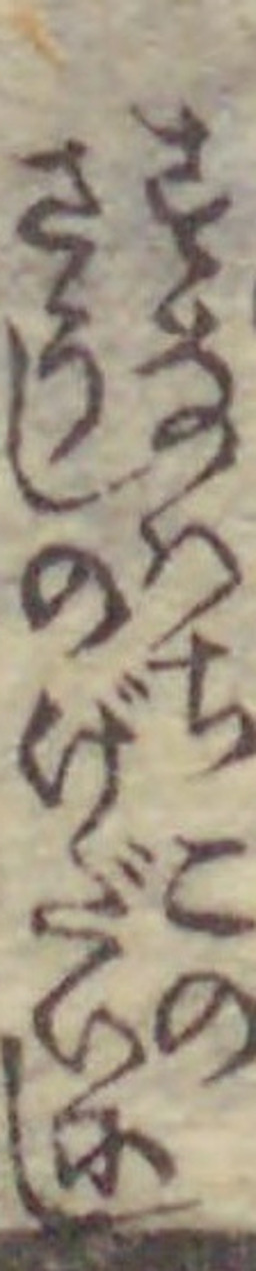さうしのげだいにし
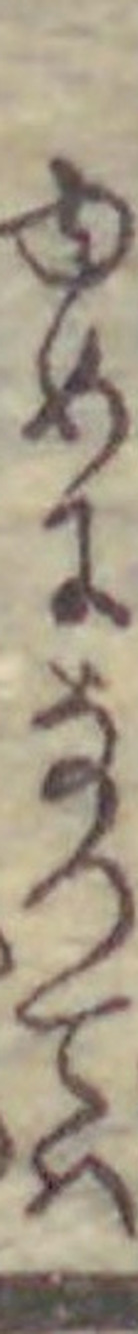ゆめになつては
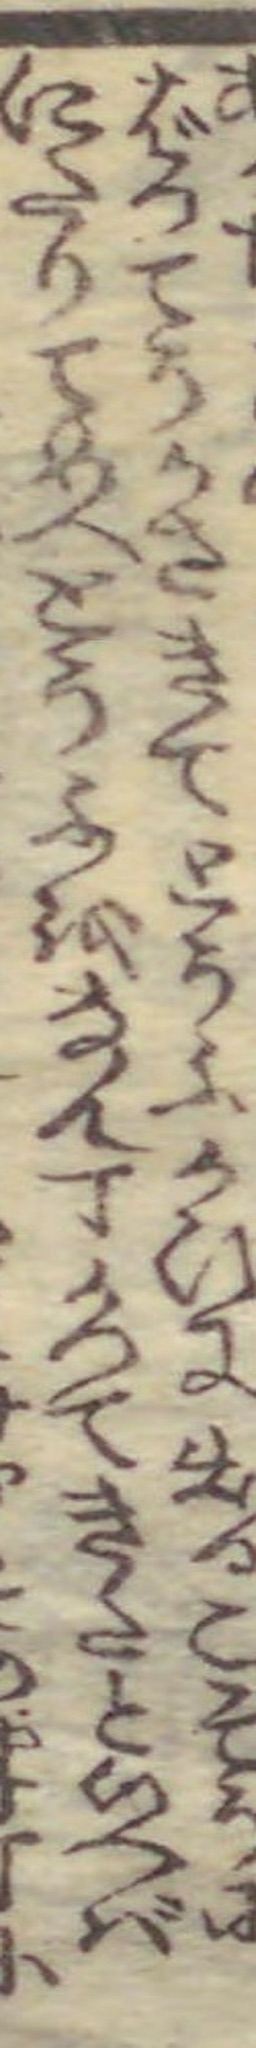にたりてめへとうふをなん丁かつてきたといへば
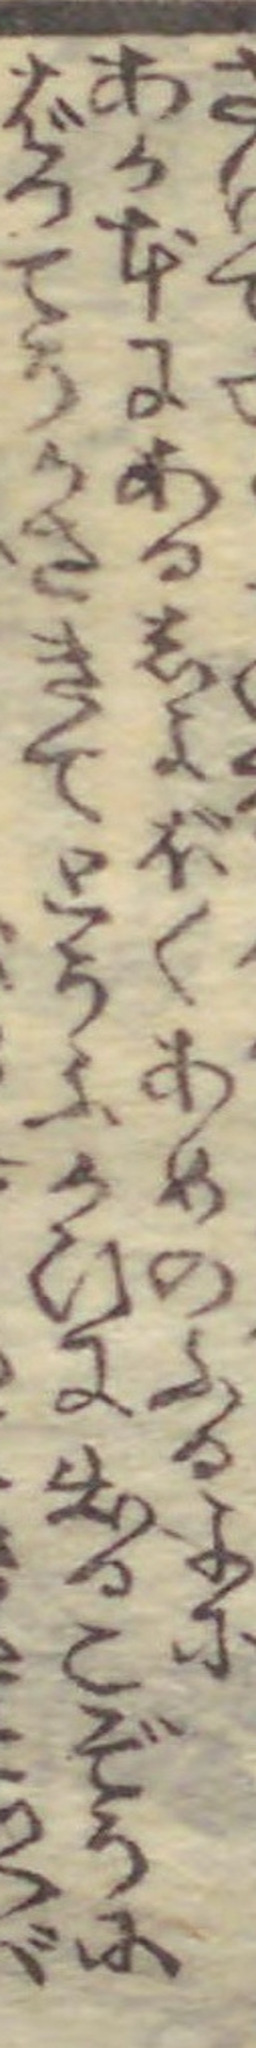ばつてうかさきてとうふかひに出るこぞうに
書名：大時代唐土化物 3巻. 曽我太夫染
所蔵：国立国会図書館 National Diet Library, JAPAN
